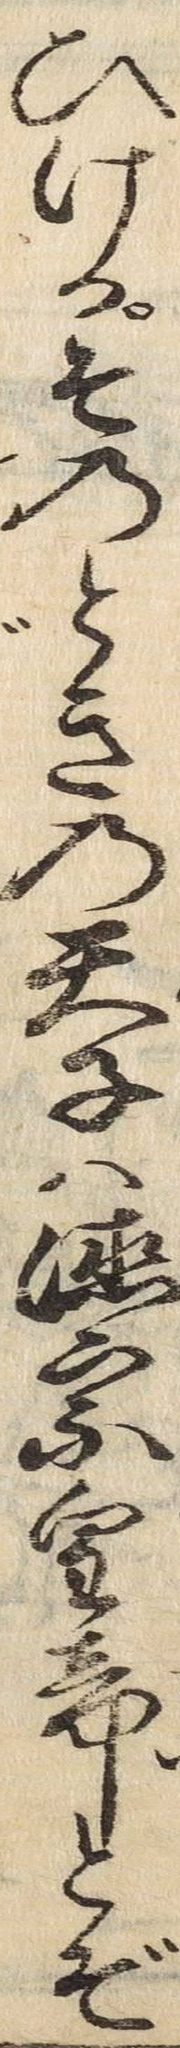ひける。そのときの天子は徳宗皇帝とぞ
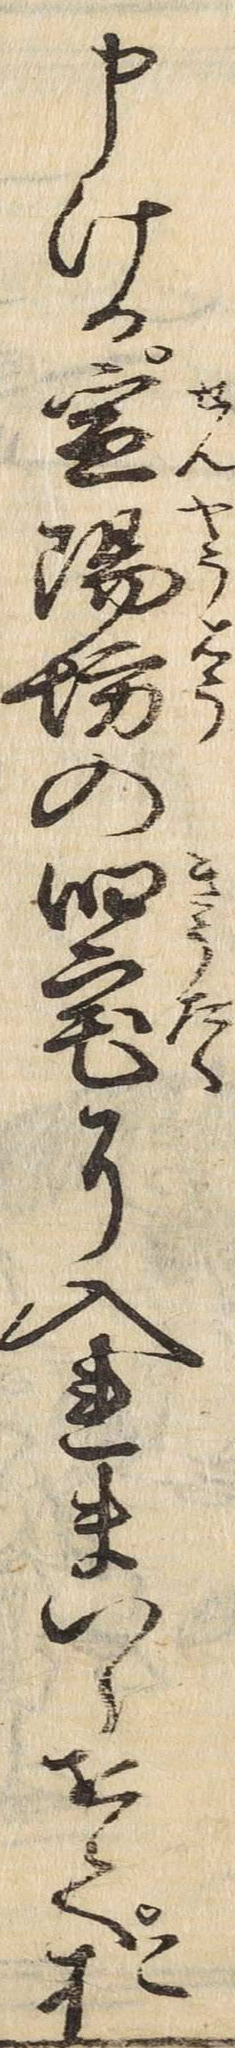申ける。宣陽坊の旧宅に入れまいらせて。お
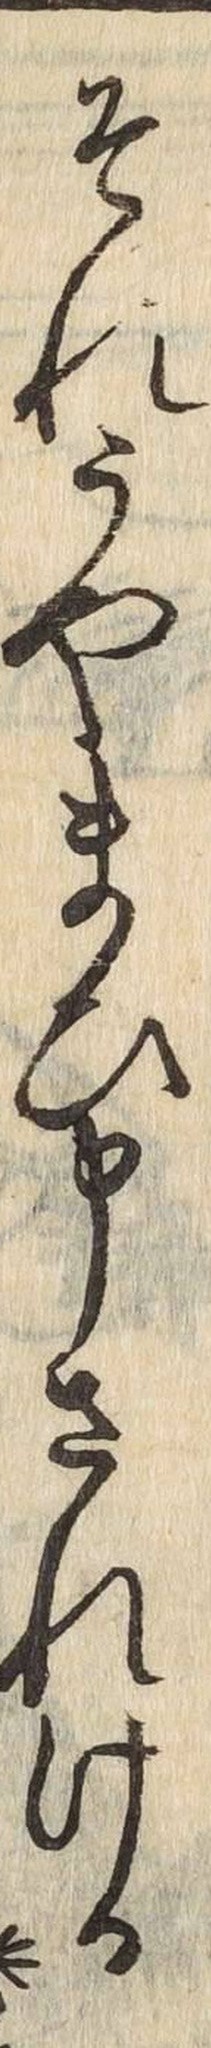それうやまひ申されける。

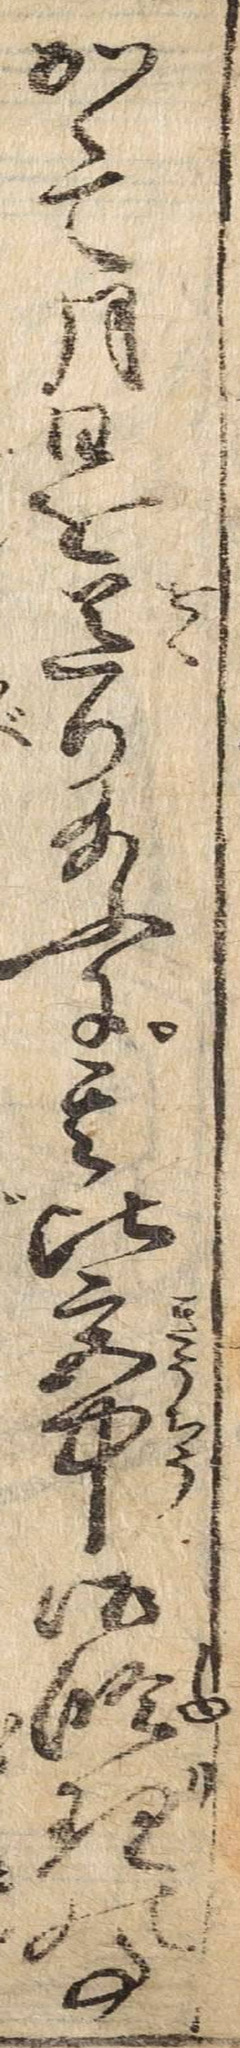かくて月日を送り給ふに。其頃宮中御修理の事
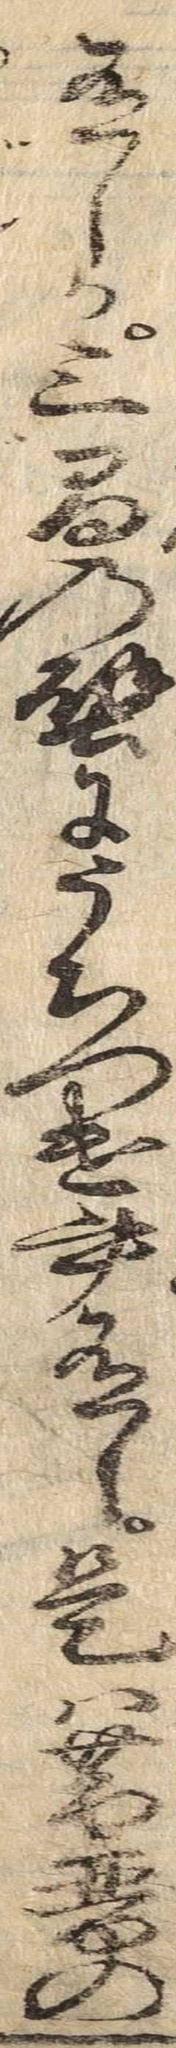有しか。三間の壁にうちつけ書有し。是は昔晋の
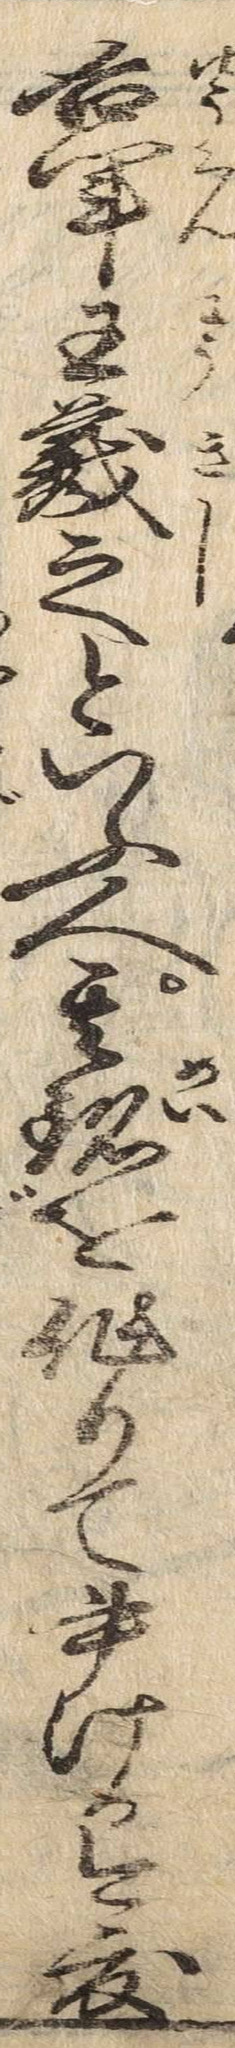右軍王羲之といふ人。其銘を作りて書る今度
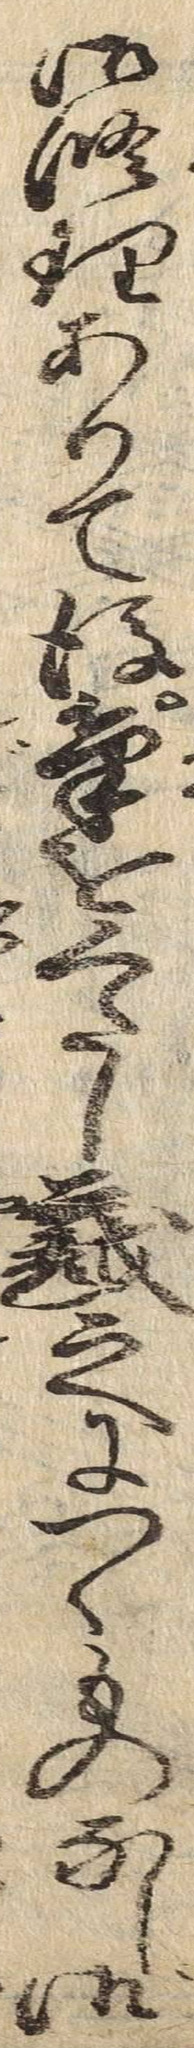御修理ありて後筆をくたし羲之につゝくものなし。御
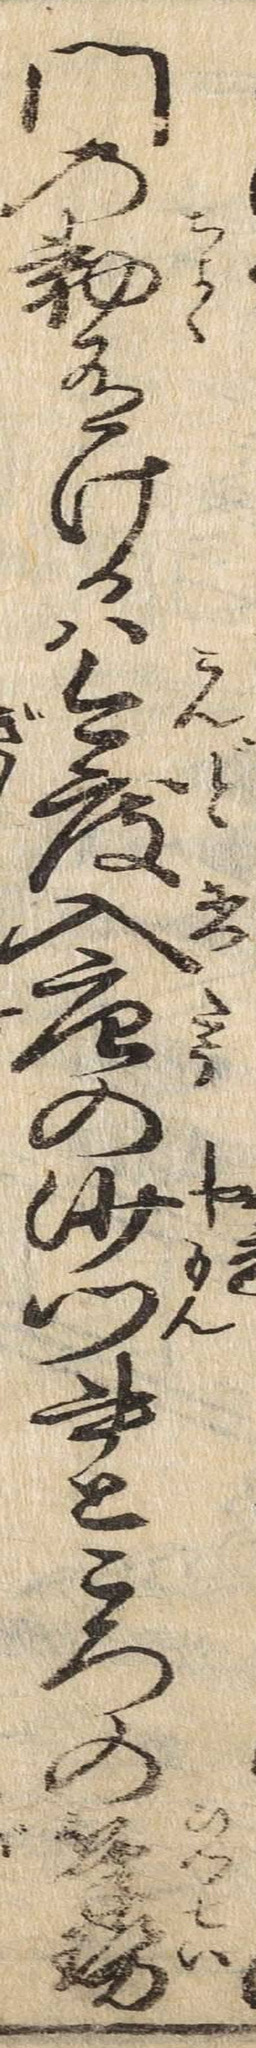門の勅有けるは今度入唐の沙門書ところの筆勢
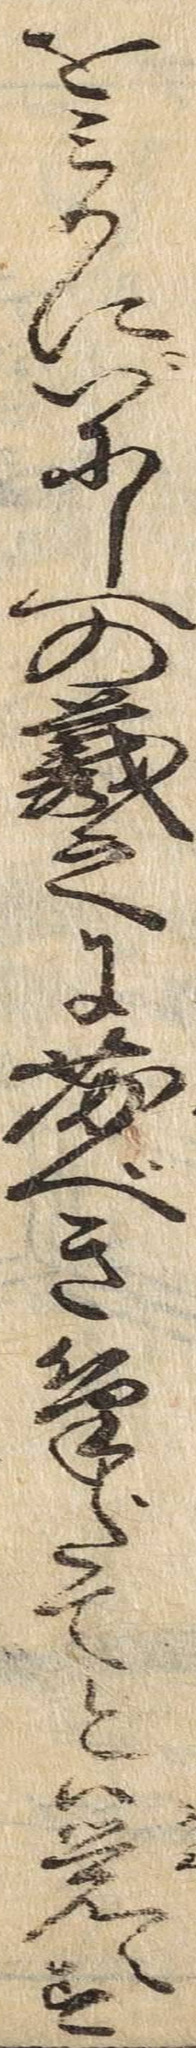をみるに。いにしへの羲之に劣べき筆だてとは覚えす
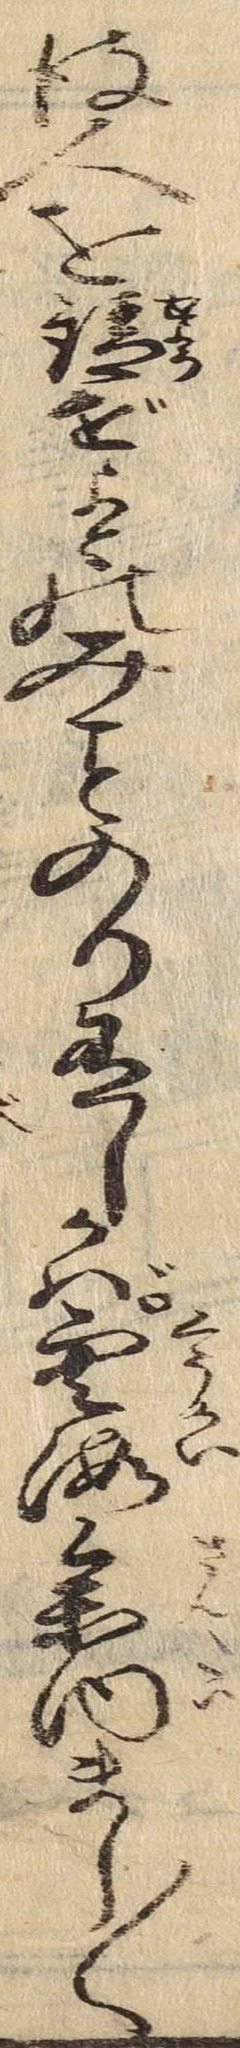彼人を請ぜよとのみことのり有しかば。空海参内まし〳〵
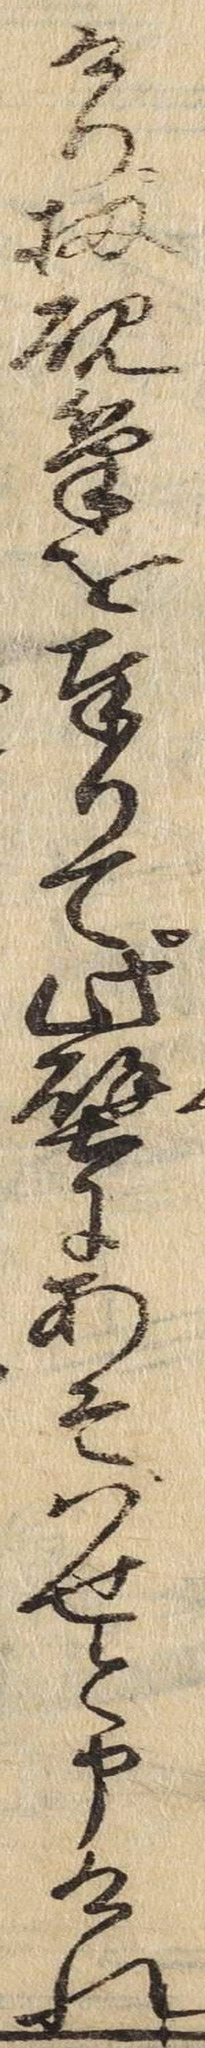けり。硯筆を奉りて。此壁にあそばせと申けれ
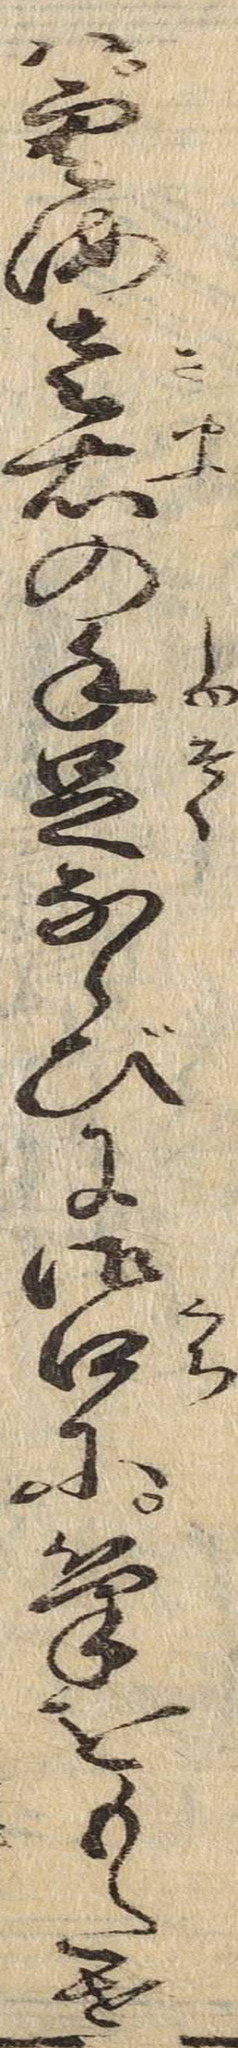は。空海左右の手足ならびに御口に。筆をもたせ
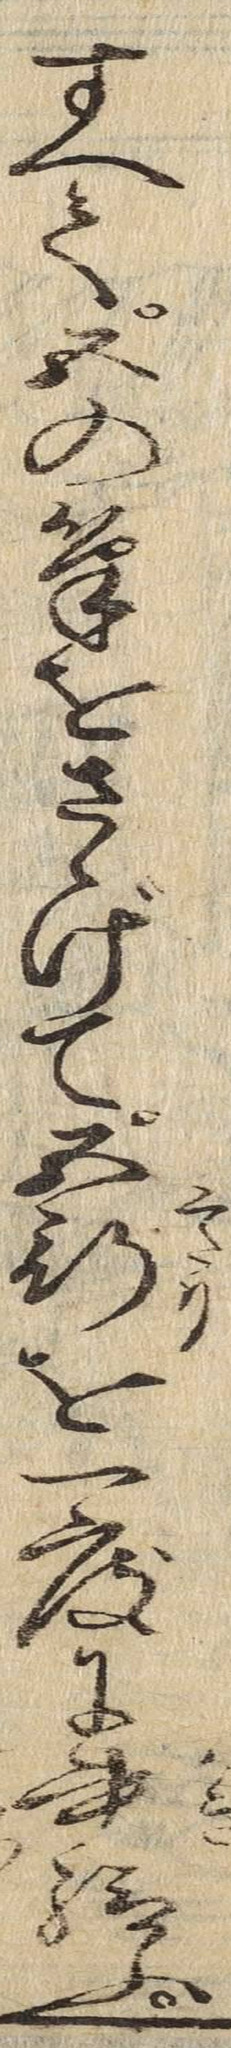すへて。五の筆をさゝげて五行を一度に書給ふ。
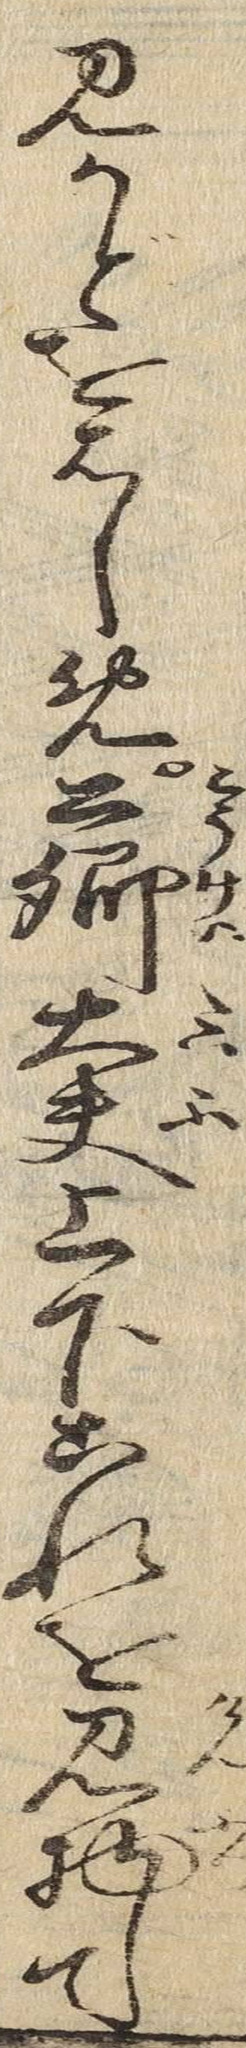みかどをはしめ。公卿大夫上下これを見物して
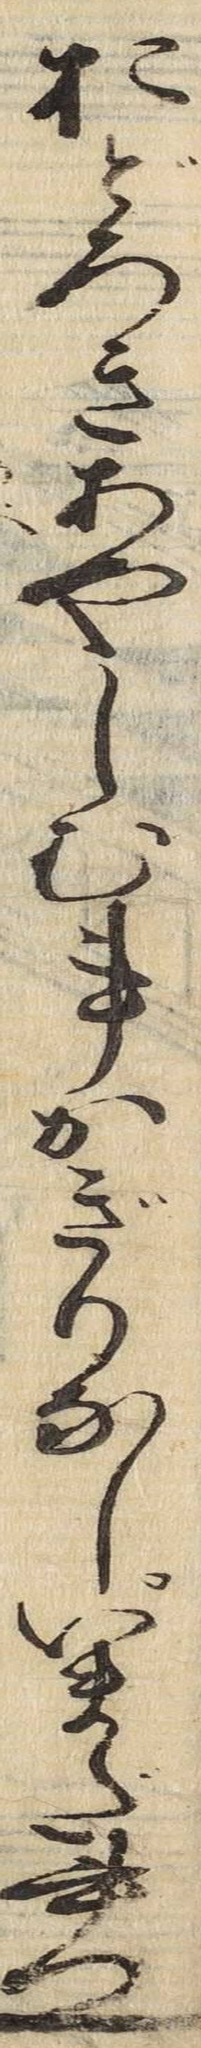おとろきあやしむ事かぎりなし。いまだ筆つ
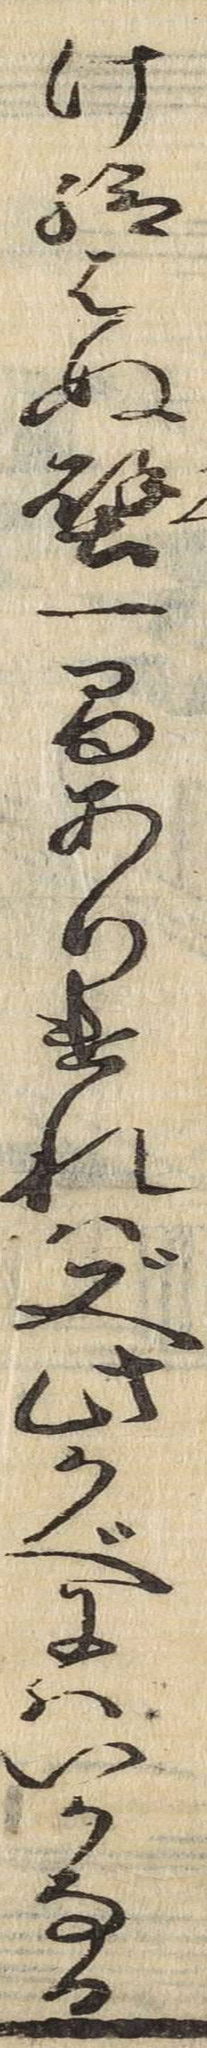け給はぬ壁一間ありければ又此かべにはいかなる
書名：弘法大師御傳記
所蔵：京都府立京都学・歴彩館 国文学研究資料館
